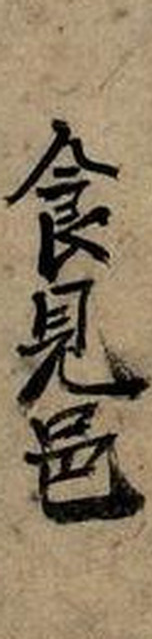食見邑
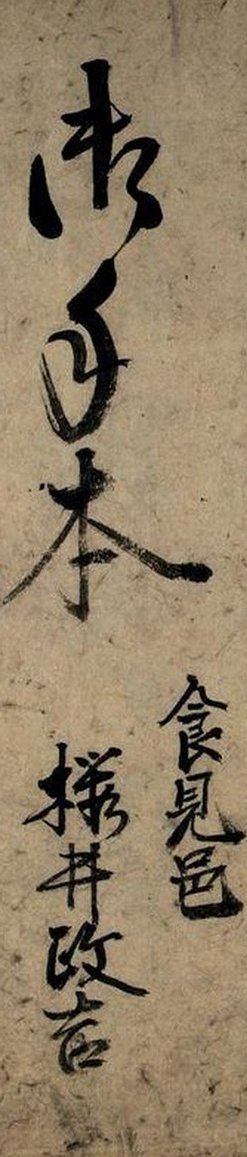御手本桜井政吉
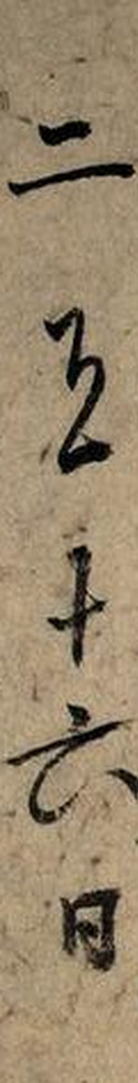二月十六日

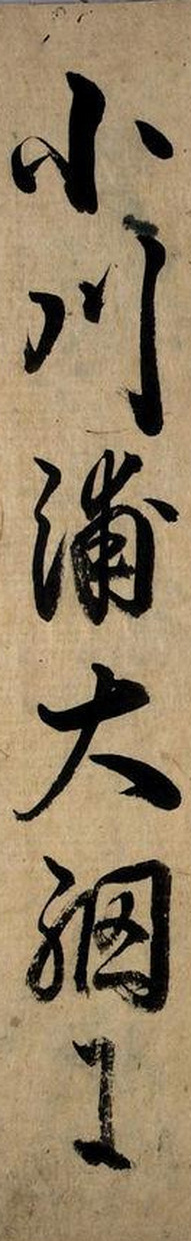小川浦大網に
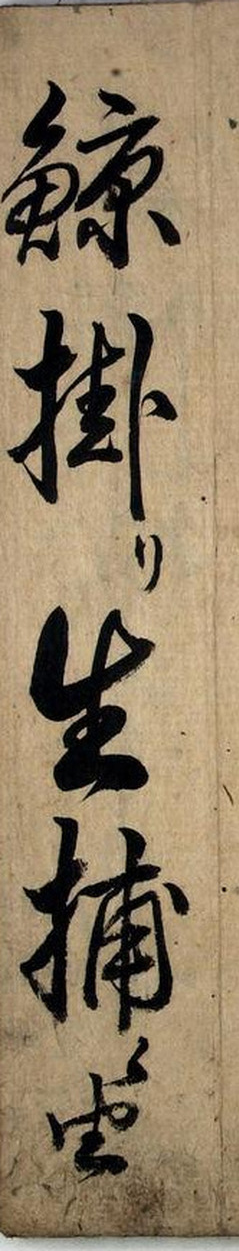鯨掛り生捕候由

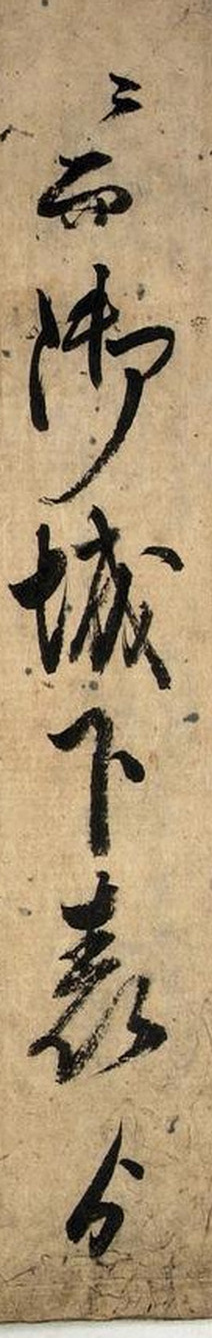ニ而御城下表ゟ
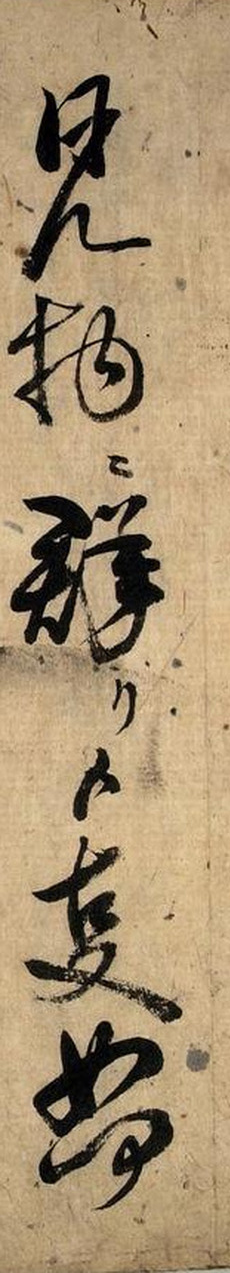見物ニ群り候事如何
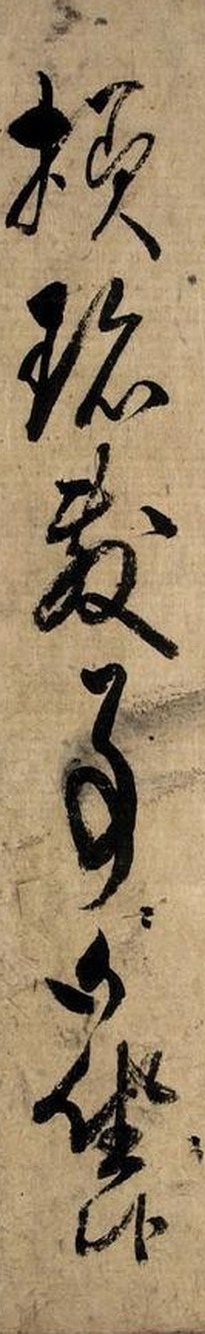様珎敷事ニ御坐候
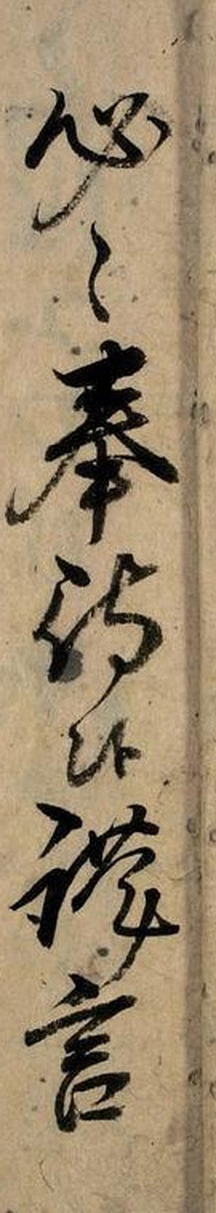必々奉待候謹言
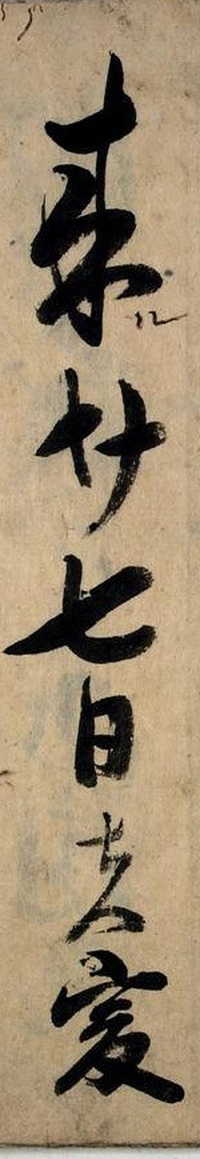来ル廿七日者爰
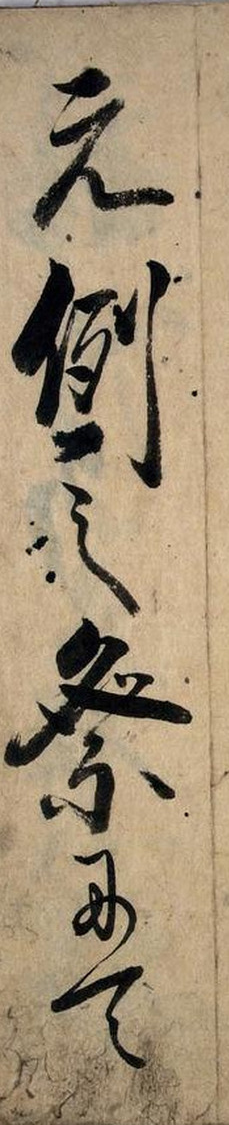元例之祭にて

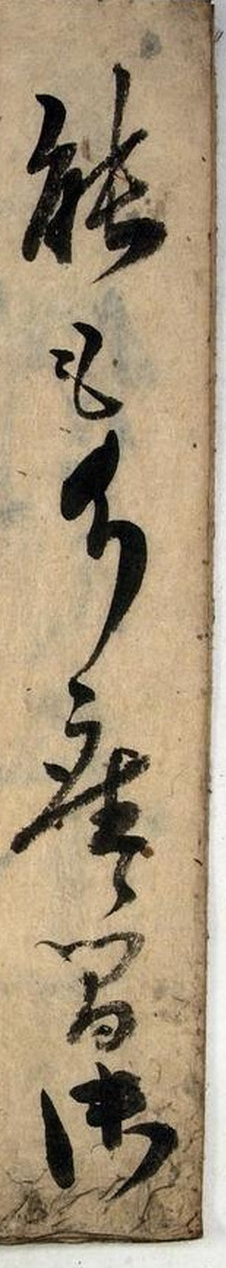能も御座候間御
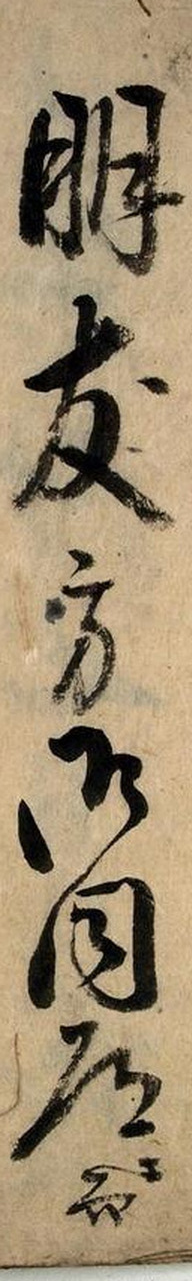朋友方御同道ニ而
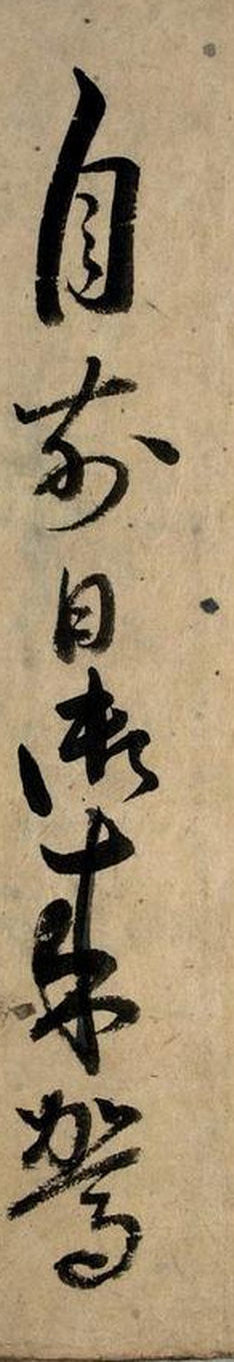自前日御来駕
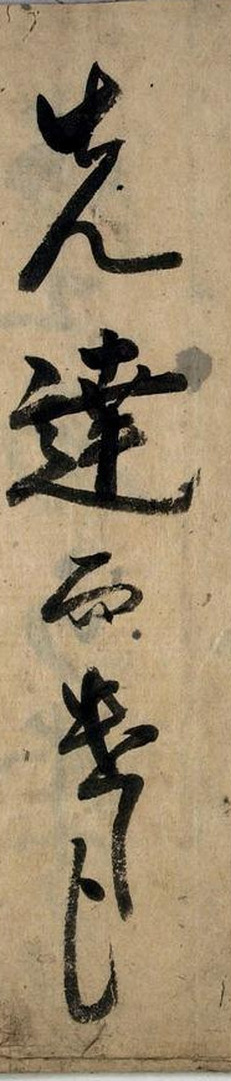先達而遣し申候
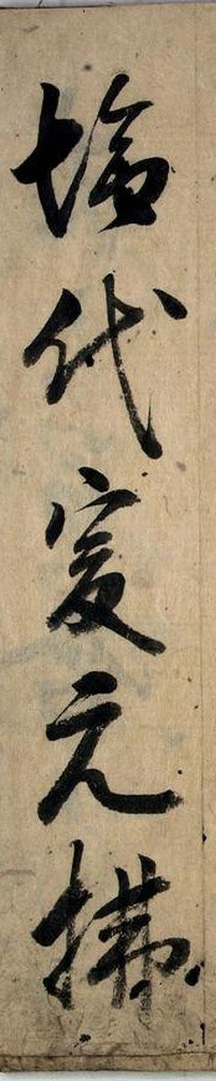塩代爰元払
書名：御手本（手習、小川浦大網に鯨掛り生捕候由ニ付）
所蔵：福井県文書館 Fukui Prefectural Archives
